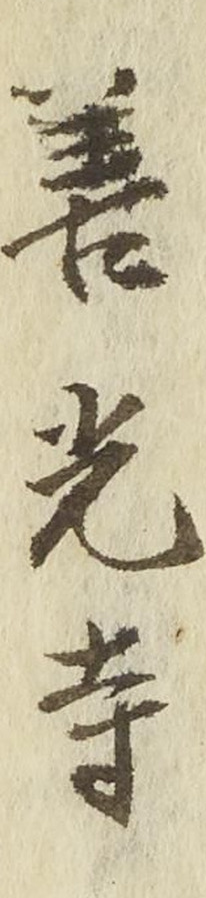善光寺
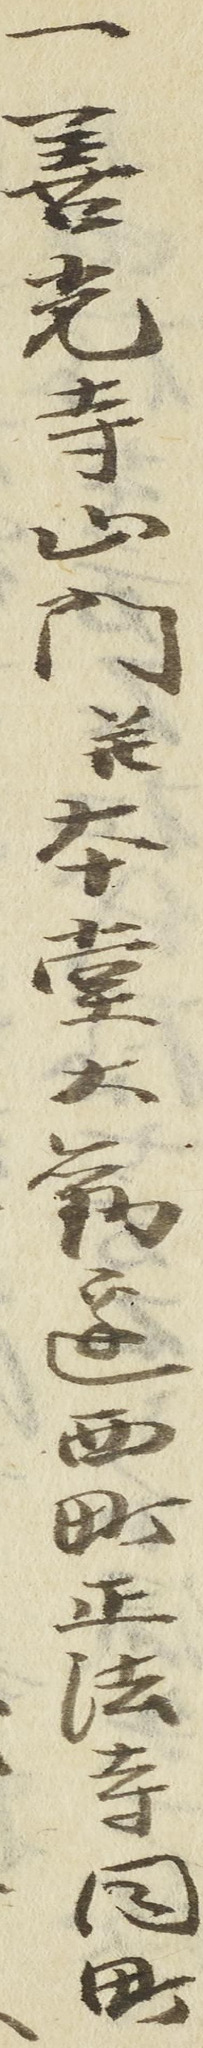一善光寺山門并本堂大勧進西町正法寺同町
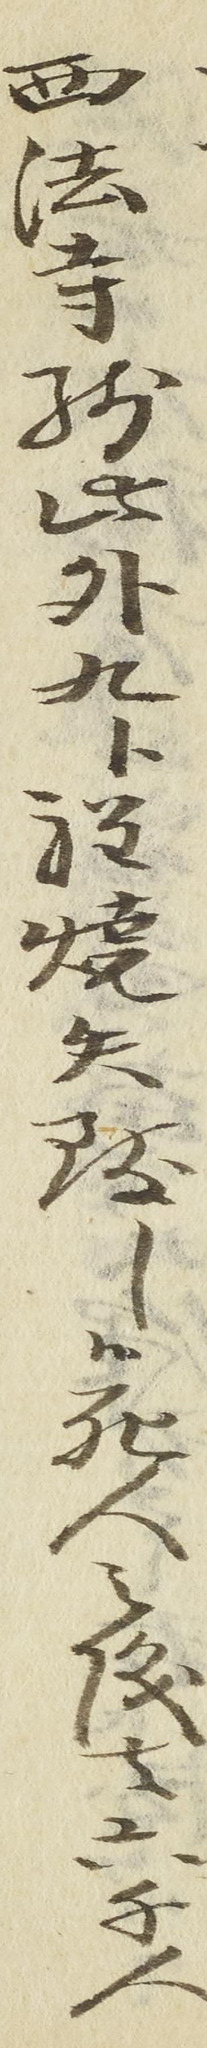西法寺残此外九分程焼失致し候死人之儀は六千人
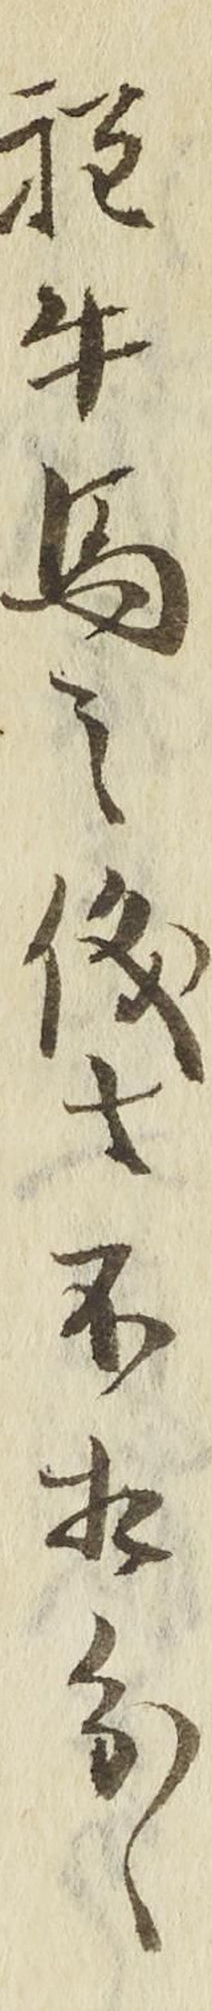程牛馬之儀は不相分候
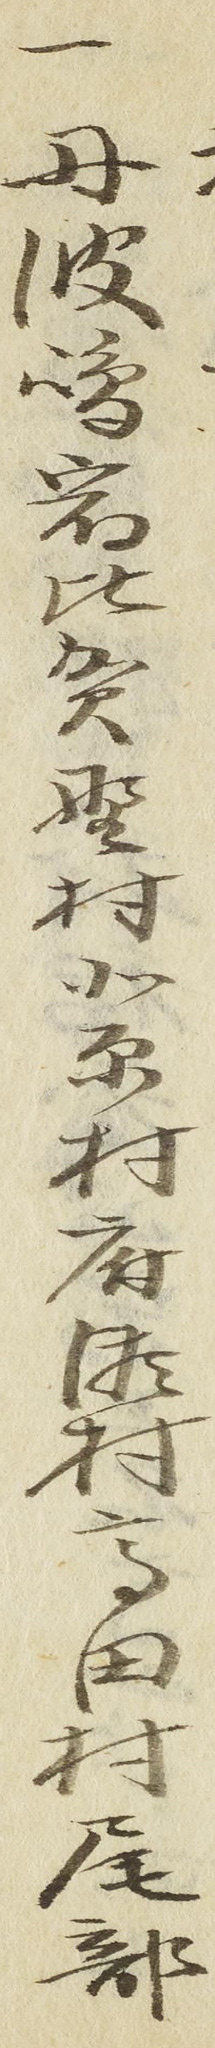一丹波嶋宿比賀野村北原村府瀬村高田村尾部
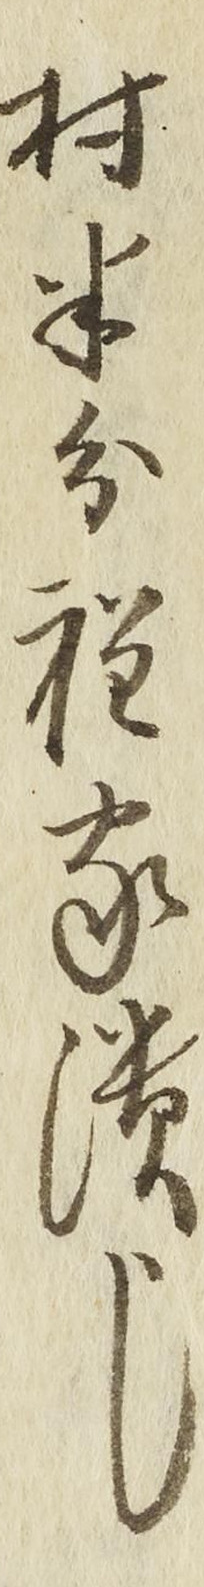村半分程家潰申候
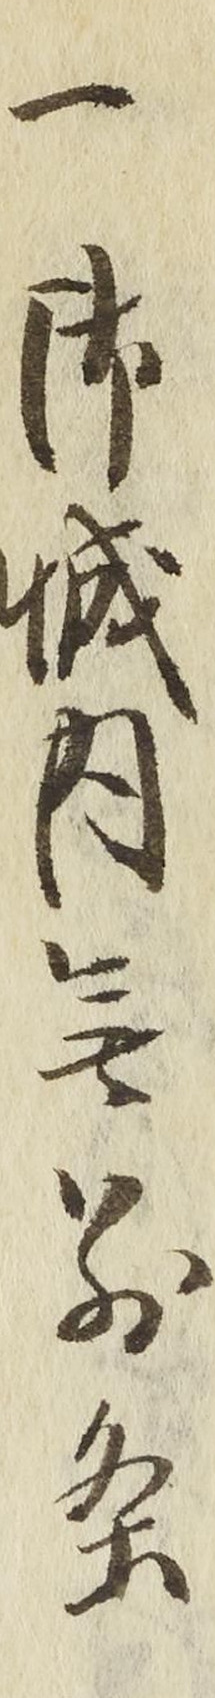一御城内無別条
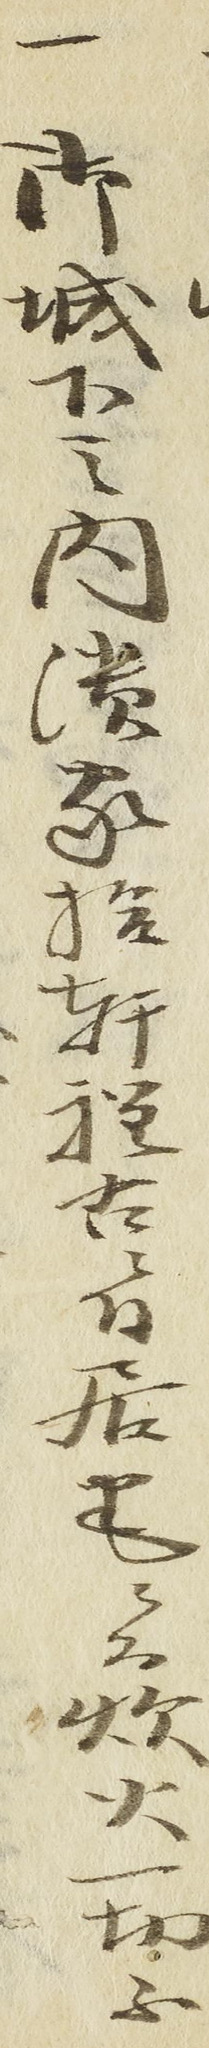一御城下之内潰家拾軒程右二付居宅二而炊火一切不
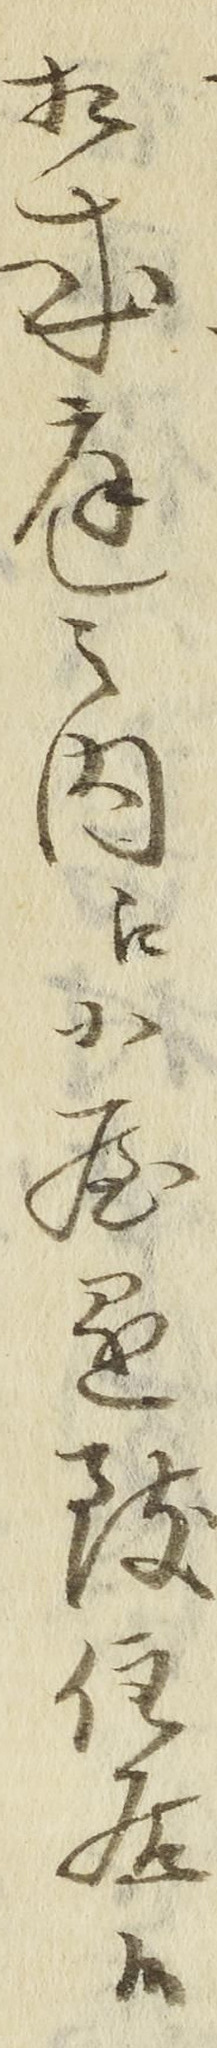相成庭之内江小屋懸致住居候
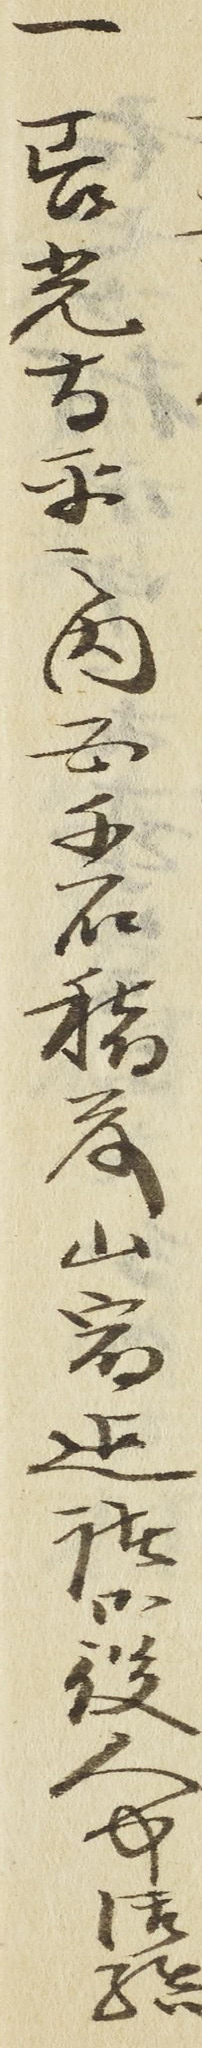一善光寺平之内五千石稲荷山宿迄諸御役人中御詰
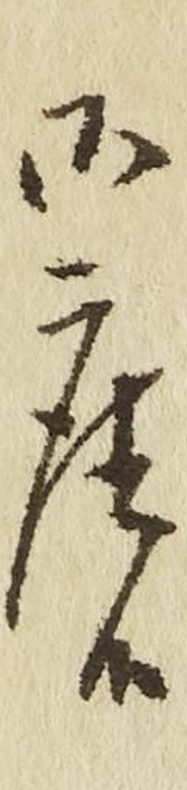御座候
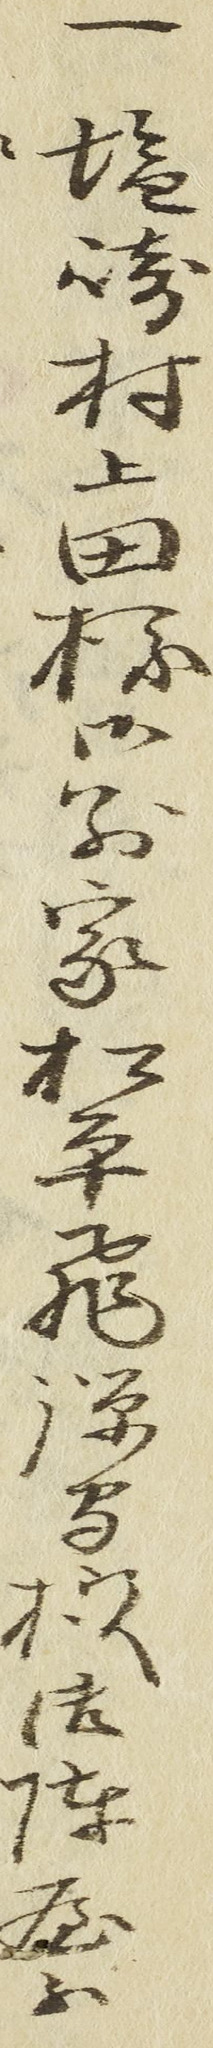一塩崎村上田様御別家松平飛騨守様御陣屋不
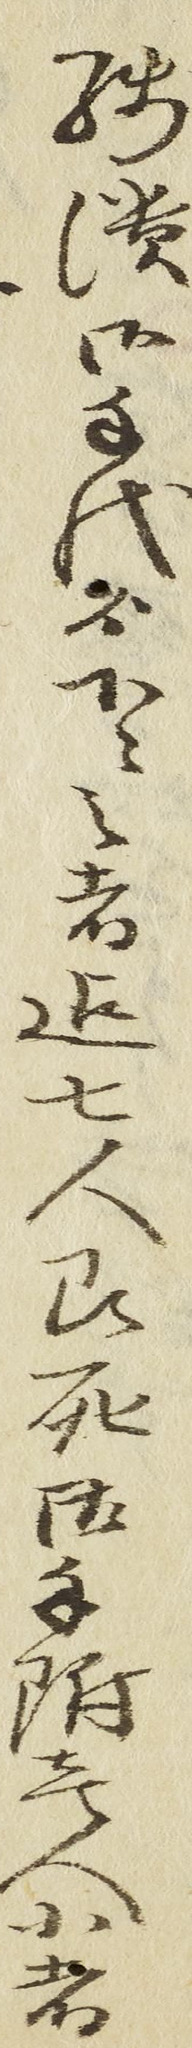残潰御手代ゟ下々之者迄七人即死御手附壱人小者
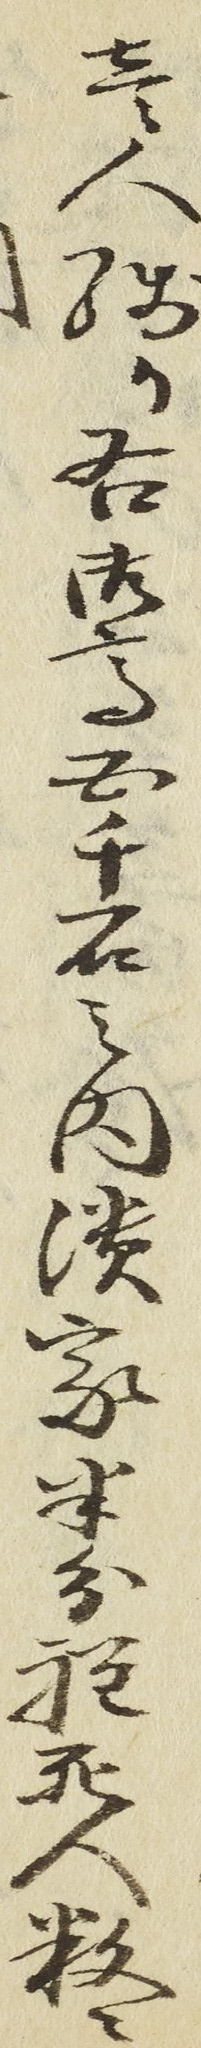壱人残り右御高五千石之内潰家半分程死人数々
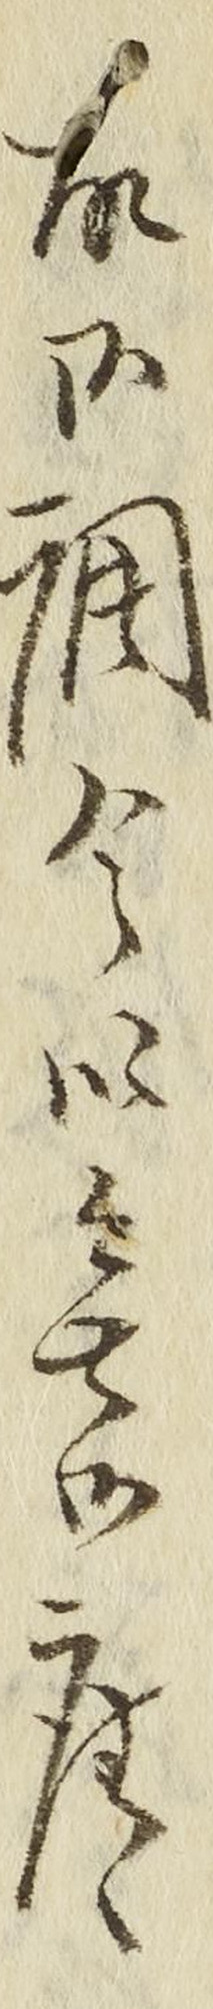故取調今以無御座候
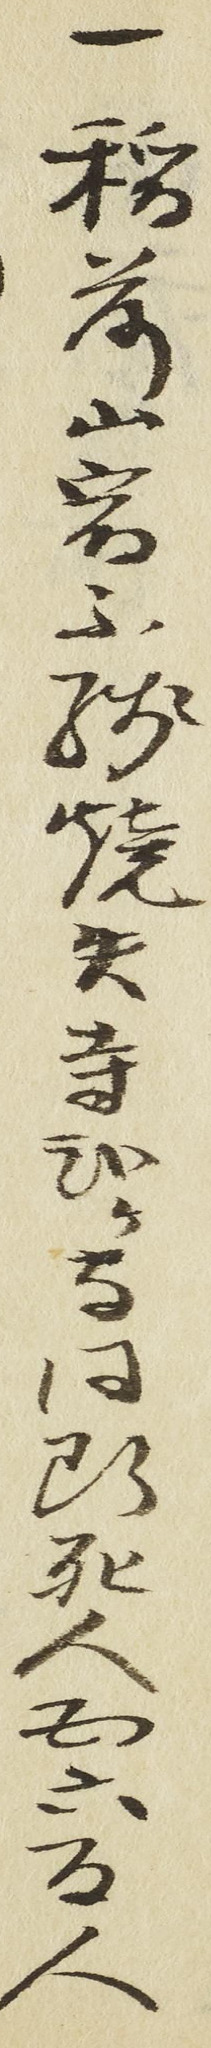一稲荷山宿不残焼失寺弐ヶ寺同断死人五六百人
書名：信濃國大地震記　乾
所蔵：東京大学地震研究所図書室 Earthquake Research Institute Library, The University of Tokyo, JAPAN
